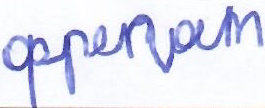фрепат
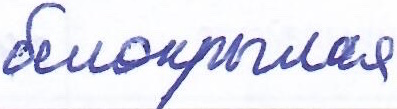белокрылая
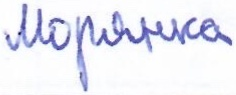морянка
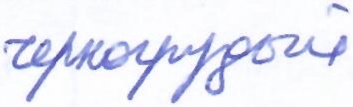черногрудый
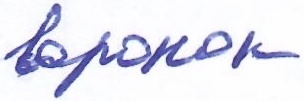воронок
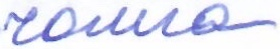чомга
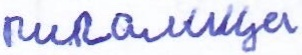пигалица
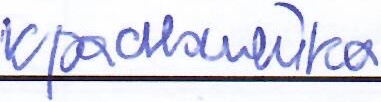красношейка
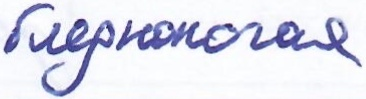бледноногая
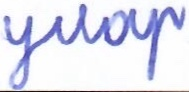улар
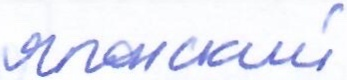японский
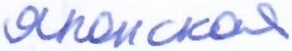японская
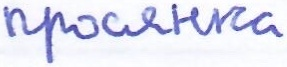просянка
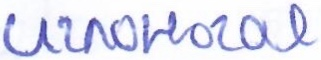иглоногая
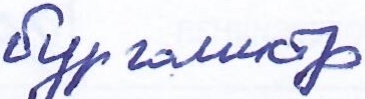бургомистр
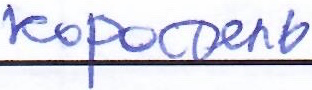коростель
